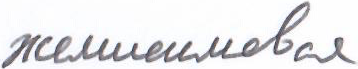желтоклювая
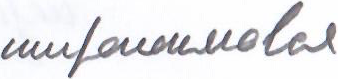ширококлювая
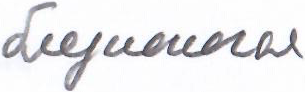бледноногая
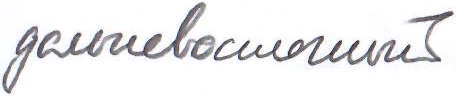дальневосточный
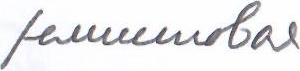реликтовая
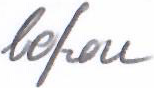ворон
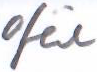орёл
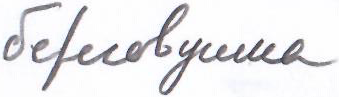береговушка
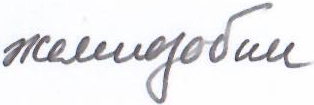желтозобик
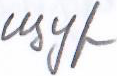щур
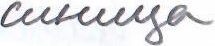синица
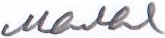малая
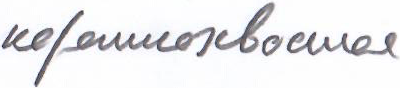короткохвостая
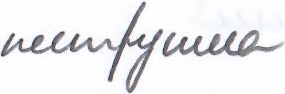пеструшка
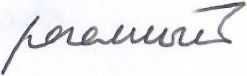рогатый
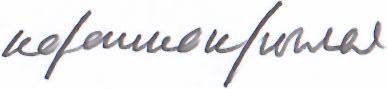короткокрылая
